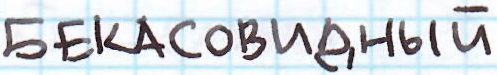бекасовидный
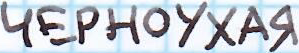черноухая
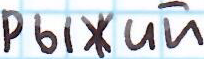рыжий
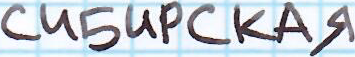сибирская
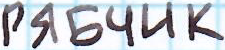рябчик
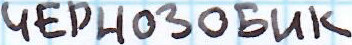чернозобик
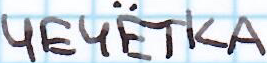чечётка
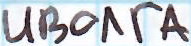иволга
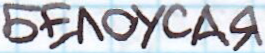белоусая
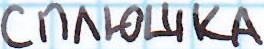сплюшка
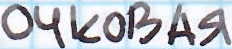очковая
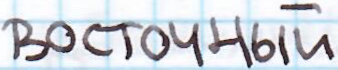восточный
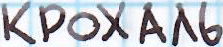крохаль
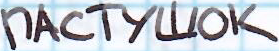пастушок
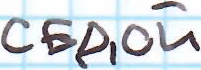седой
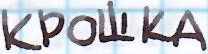крошка
